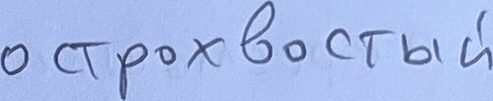острохвостый
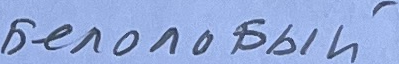белолобый
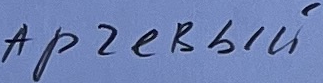арчевый
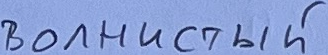волнистый
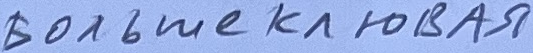большеклювая
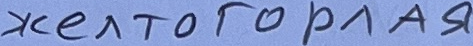желтогорлая
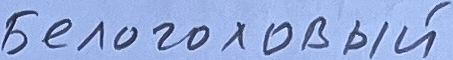белоголовый
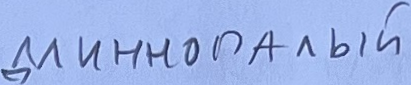длиннопалый
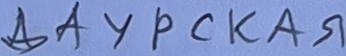даурская
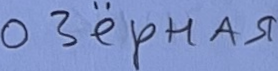озёрная
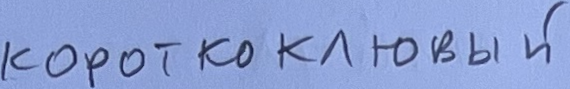короткоклювый
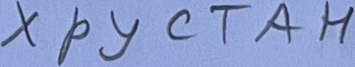хрустан
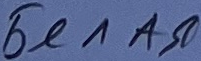белая
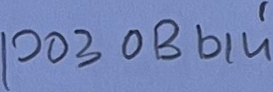розовый
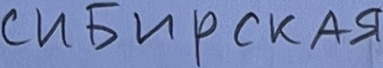сибирская
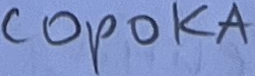сорока
